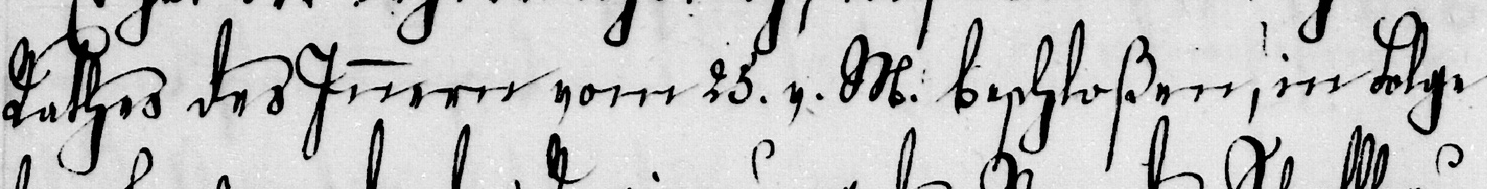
Rathes des Innern vom 25. v. M. beschloßen, in Folge
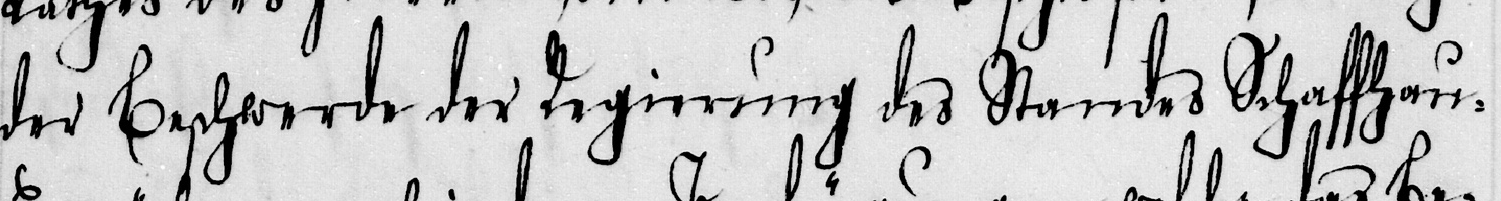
der Beschwerde der Regierung des Standes Schaffhau¬
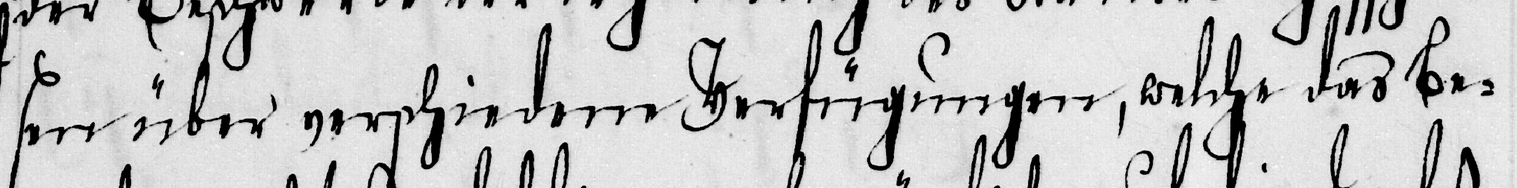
sen über verschiedene Verfügungen, welche das Be¬
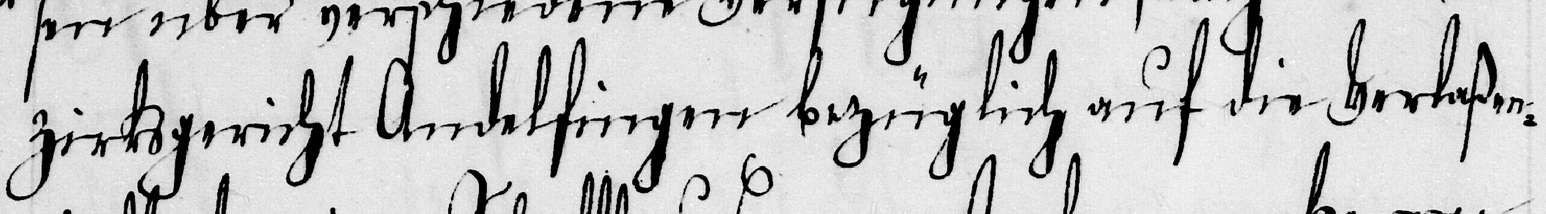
zirksgericht Andelfingen bezüglich auf die Verlaßen¬
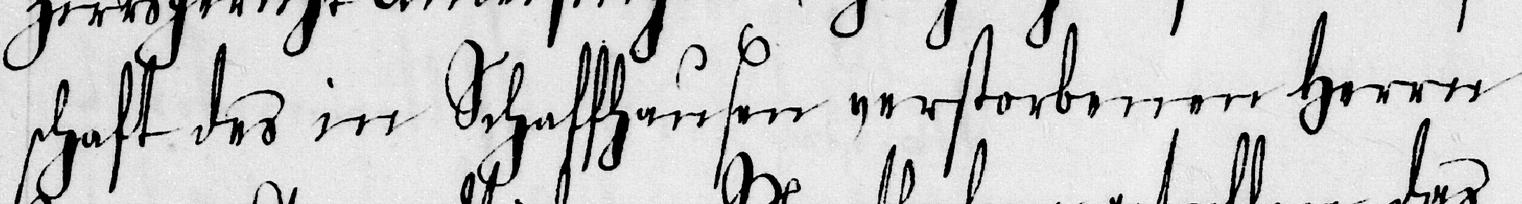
schaft des in Schaffhausen verstorbenen Herrn
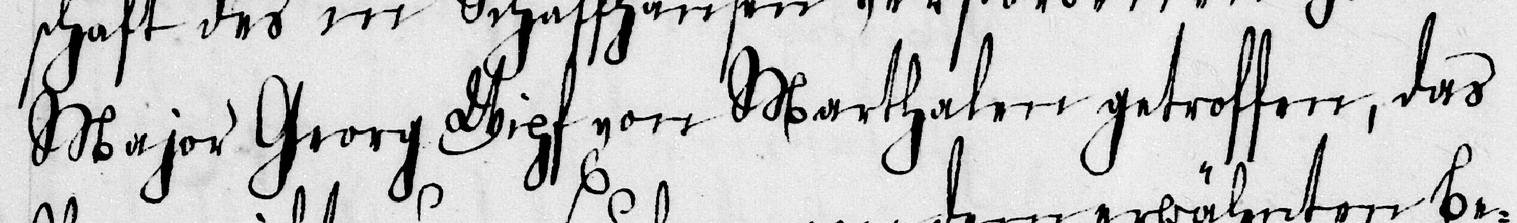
Major Georg Wipf von Marthalen getroffen, das
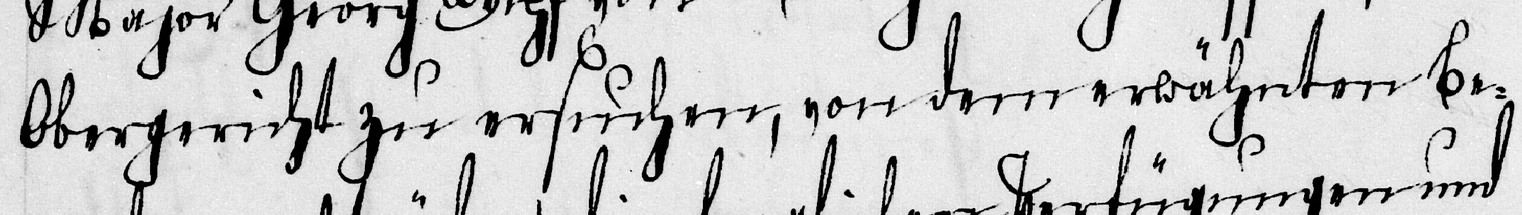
Obergericht zu ersuchen, von dem erwähnten Be¬
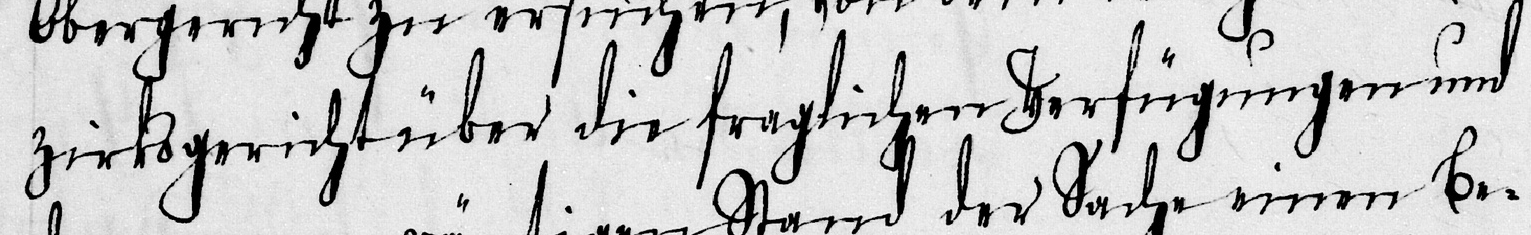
zirksgericht über die fraglichen Verfügungen und
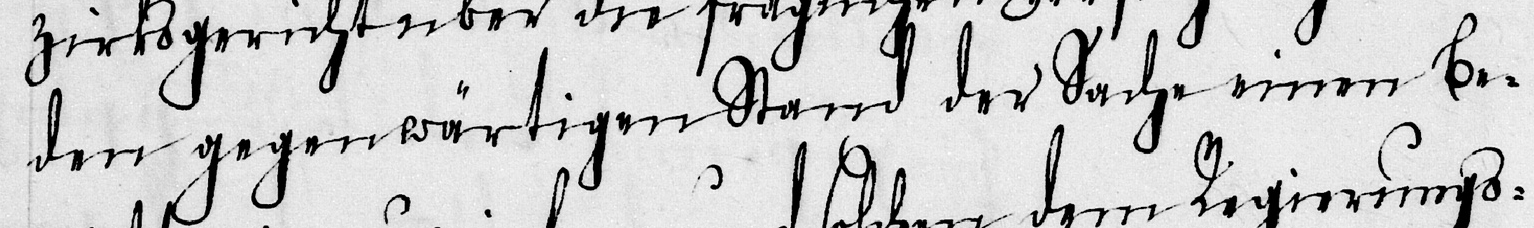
den gegenwärtigen Stand der Sache einen Be¬
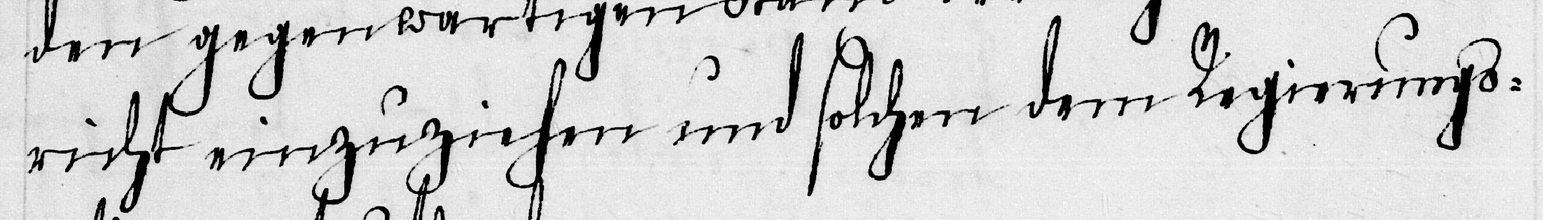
richt einzuziehen und solchen dem Regierungs¬
